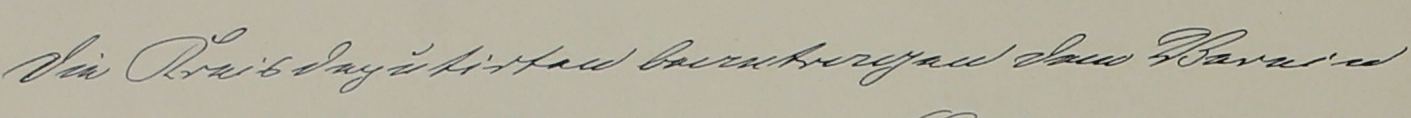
Die Kreisdeputirten beantragen dem Verein
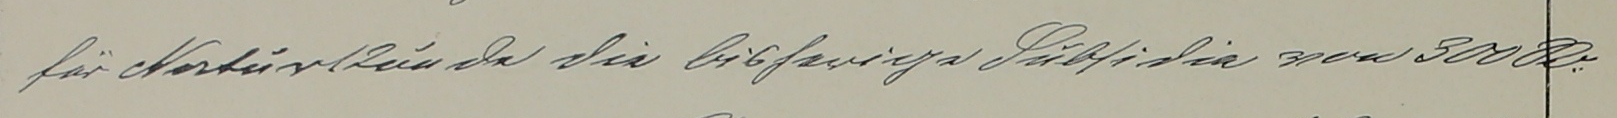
für Naturkunde die bisherige Subsidie von 300 Ro.
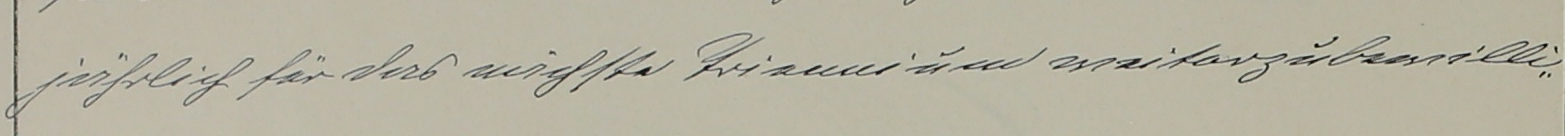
jährlich für das nächste Triennium weiterzubewilli-
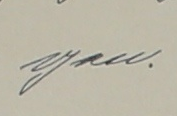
gen.
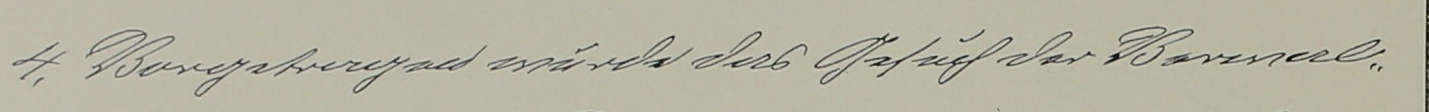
4. Vorgetragen wurde das Gesuch der Verwal-
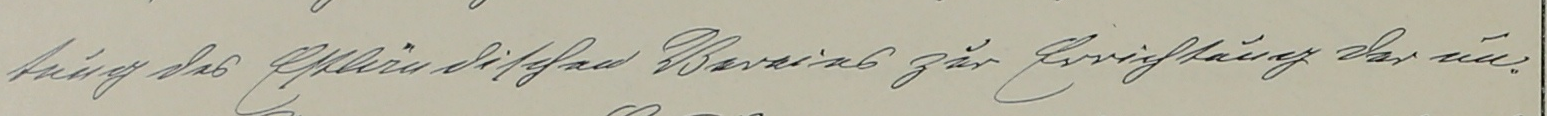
tung des Estländischen Vereins zur Errichtung der un-
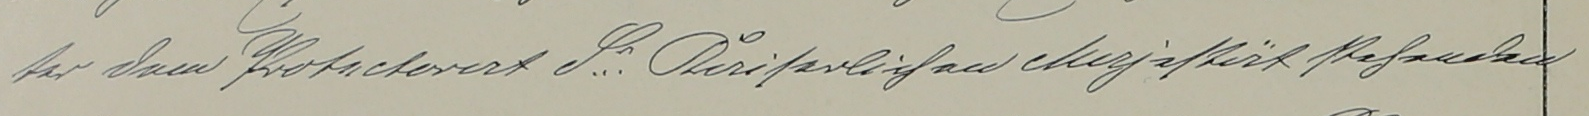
ter dem Protectorat Sr. Kaiserlichen Majestät stehenden
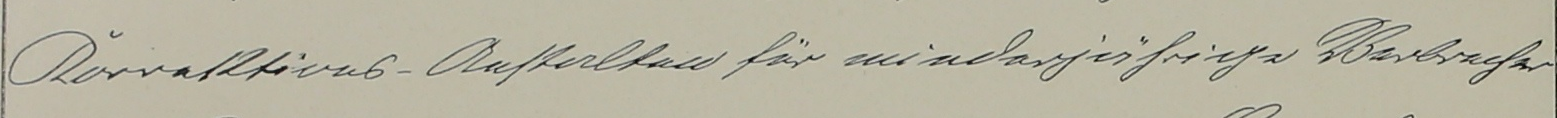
Korrektions-Anstalten für minderjährige Verbrecher
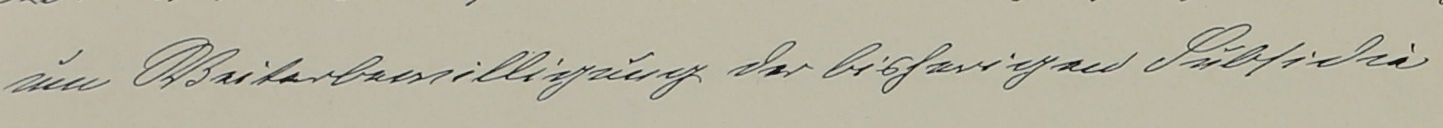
um Weiterbewilligung der bisherigen Subsidie.
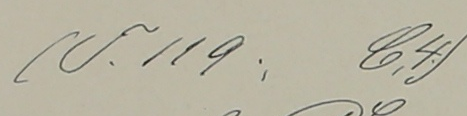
(T.119; C.4).
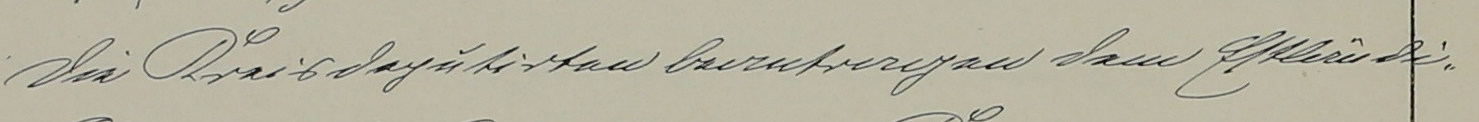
Die Kreisdeputirten beantragen dem Estländi-
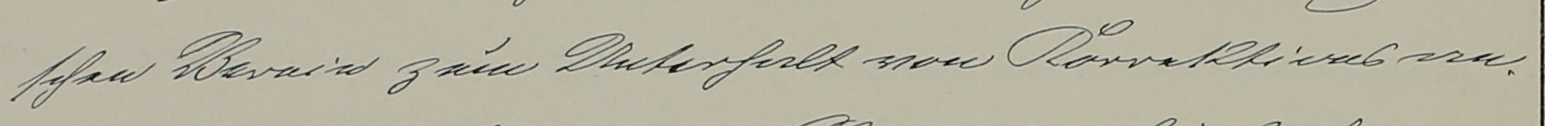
schen Verein zum Unterhalt von Korrektionsan-
